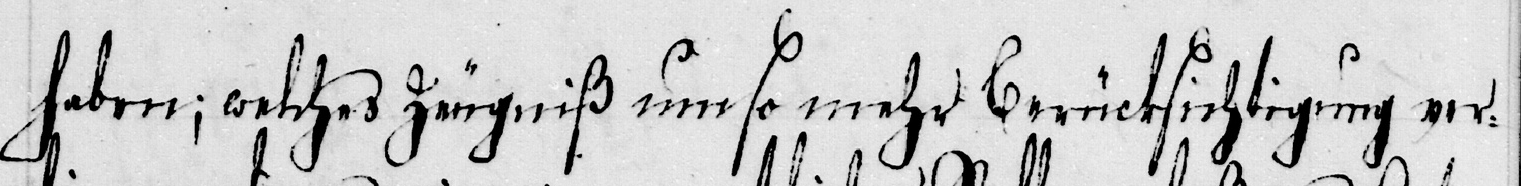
haben; welches Zeugniß umso mehr Berücksichtigung ver¬
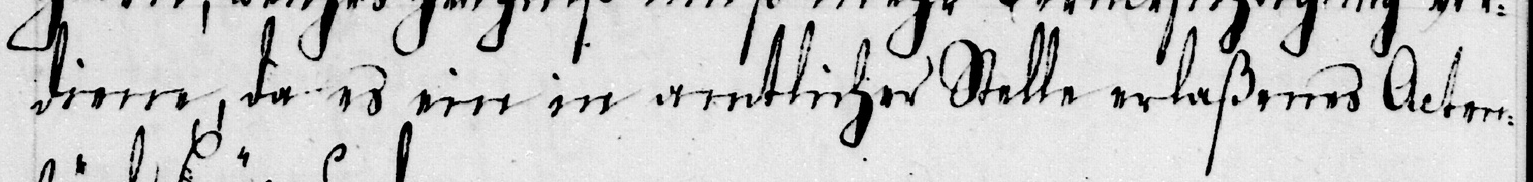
diene, da es ein in amtlicher Stelle erlaßenes Acten¬
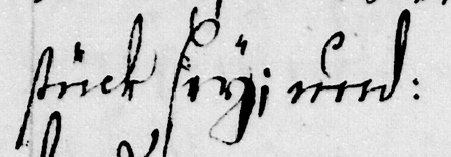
stück sey; und:
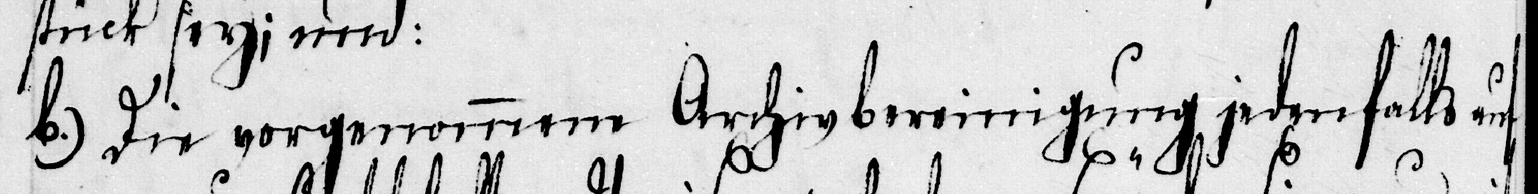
b.) Die vorgenommene Archivbereinigung jedenfalls auf
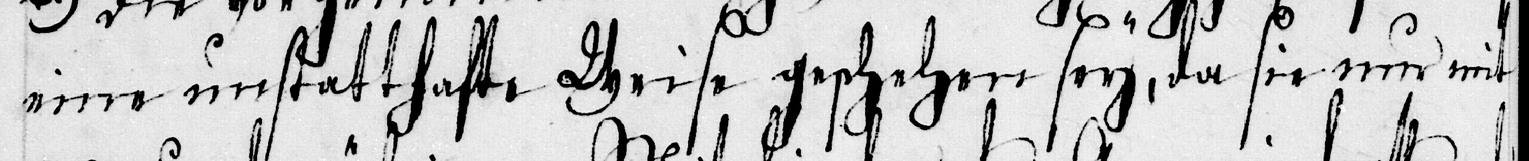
eine unstatthafte Weise geschehen sey, da sie nur mit
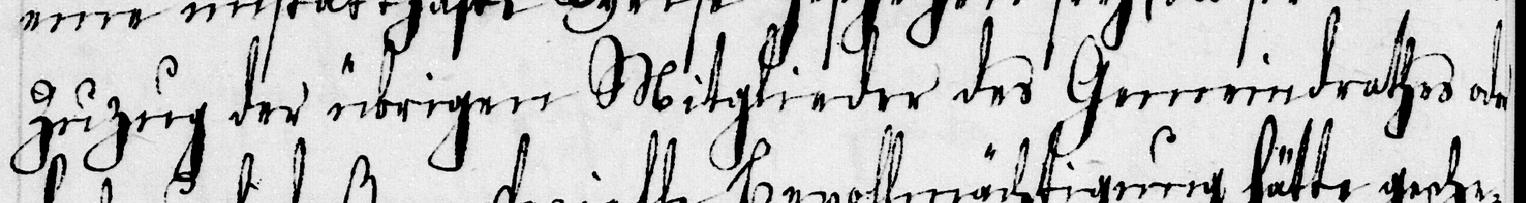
Zuzug der übrigen Mitglieder des Gemeindrathes o¬
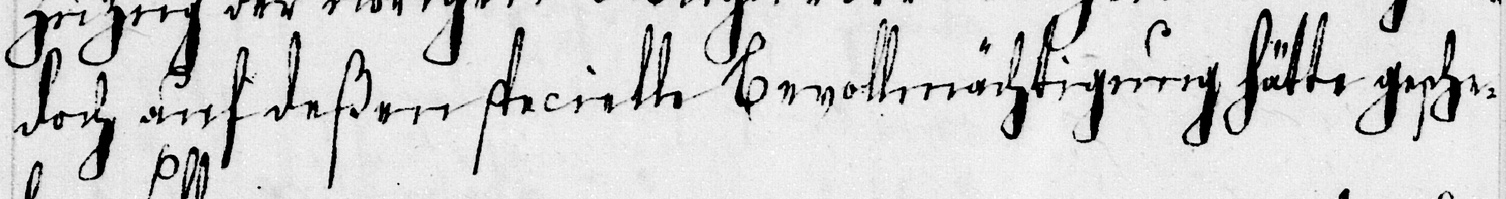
doch auf deßen specielle Bevollmächtigung hätte gesche¬
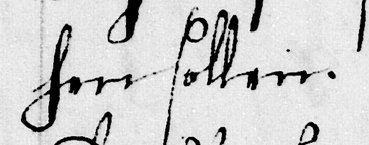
hen sollen.
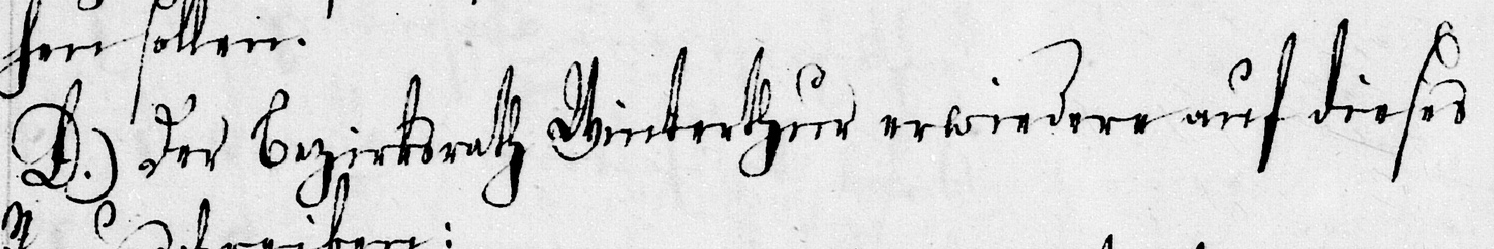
D.) Der Bezirksrath Winterthur erwiedere auf dieses
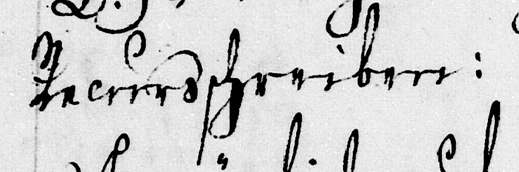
Recursschreiben:
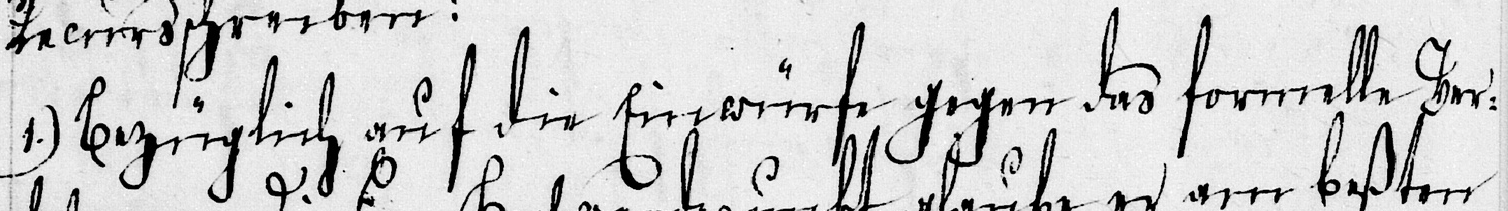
1.) Bezüglich auf die Einwürfe gegen das formelle Ver¬
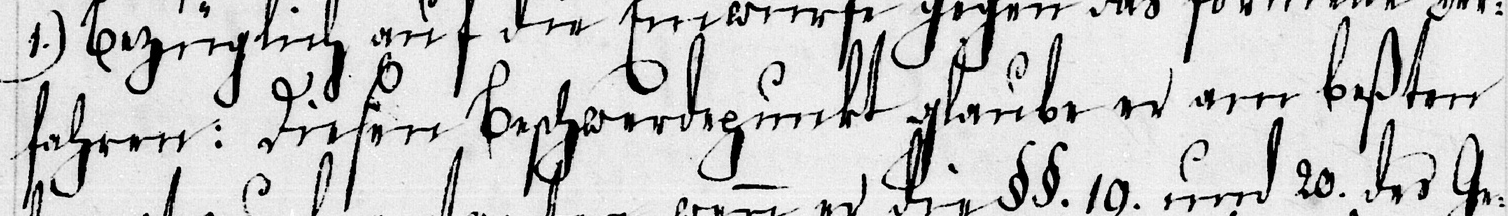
fahren: Diesen Beschwerdepunkt glaube er am beßten
